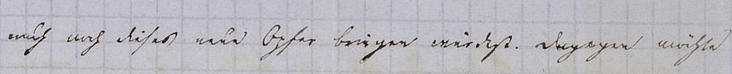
auch noch dieses neue Opfer bringen würdest. Dagegen möchte
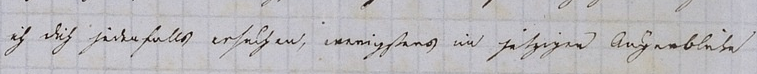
ich Dich jedenfalls ersuchen, wenigstens im jetzigen Augenblicke
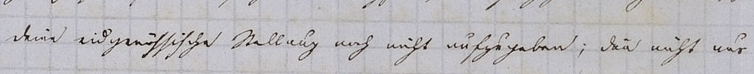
Deine eidgenössische Stellung noch nicht aufzugeben; denn nicht nur
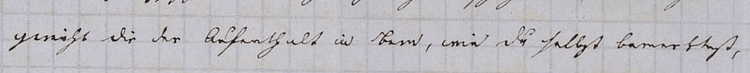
gereicht Dir der Aufenthalt in Bern, wie Du selbst bemerktest,
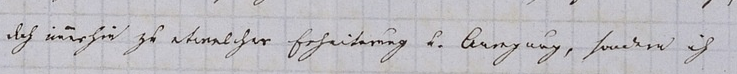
doch immerhin zu etwelcher Erheiterung u. Anregung, sondern ich
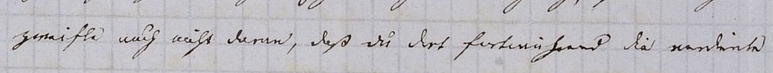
zweifle auch nicht daran, daß Du dort fortwährend die verdiente
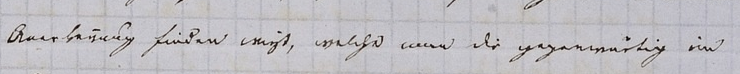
Anerkennung finden wirst, welche man Dir gegenwärtig im
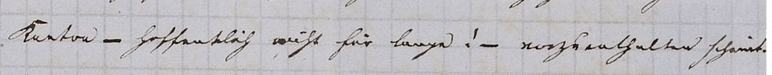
Kanton – hoffentlich nicht für lange! – vorzuenthalten scheint.
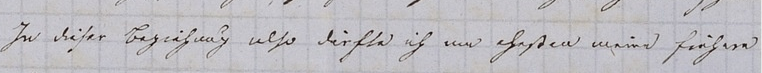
In dieser Beziehung also dürfte ich am ehesten meine frühere
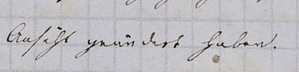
Ansicht geändert haben.
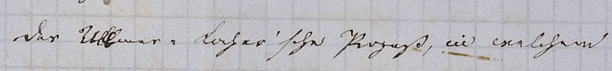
Der Ullmer-Locher'sche Prozeß, in welchem
